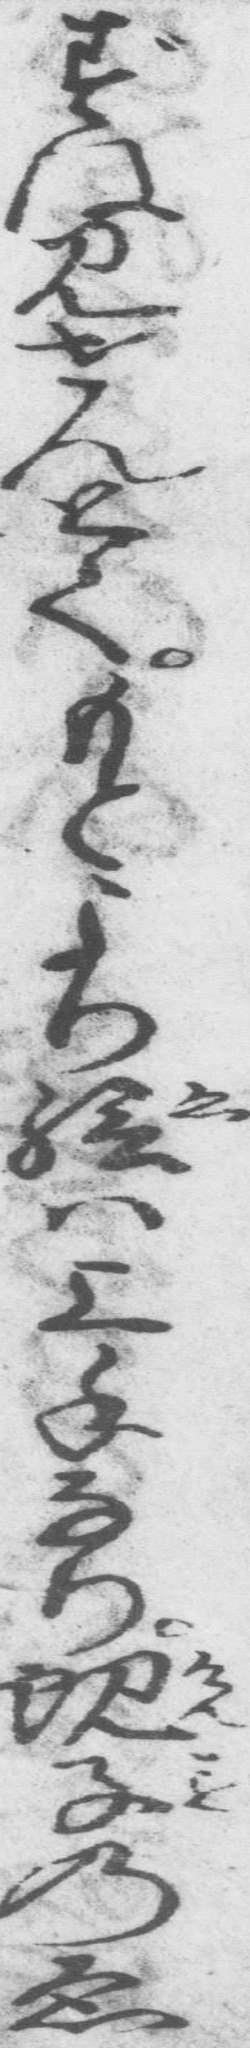ずは見せんとて。もとより絵は上手なり。蜆子のゑ

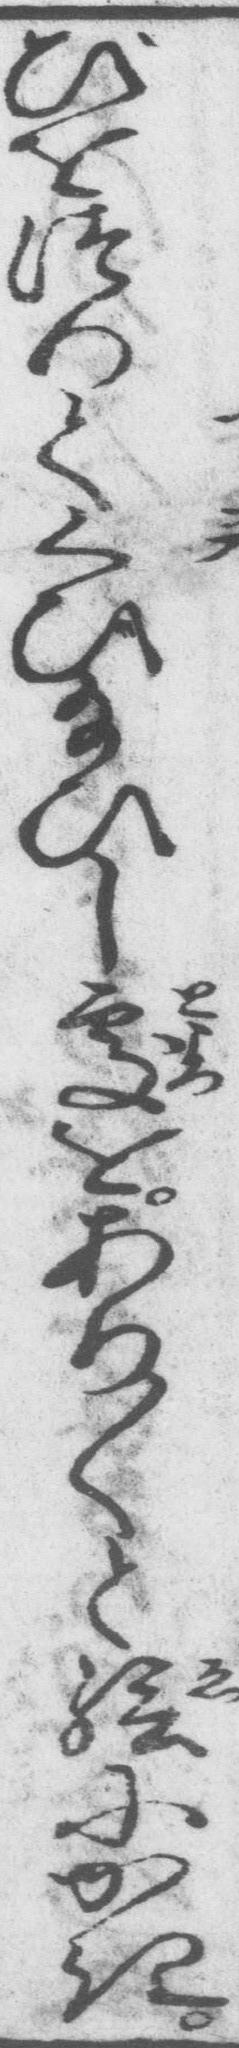びをつりてくひ給ひし処を。あり〳〵と絵にかき。
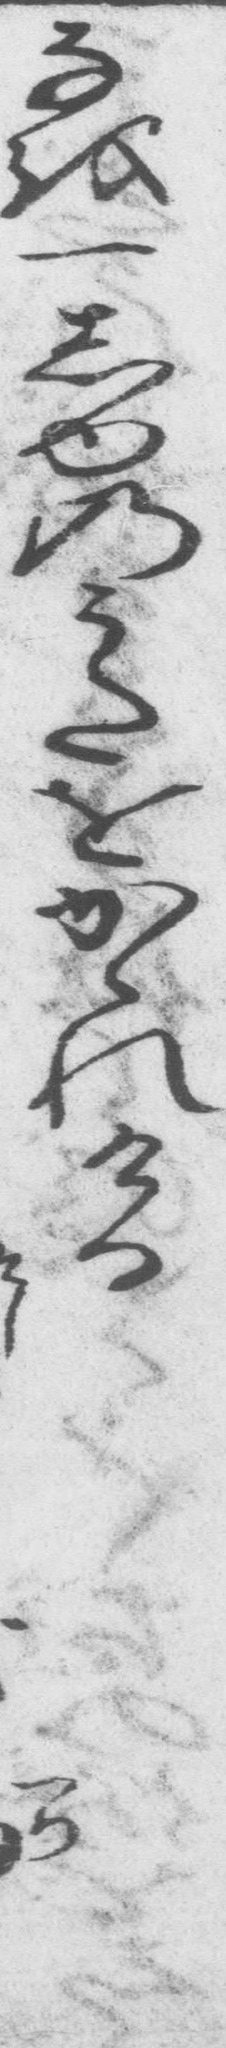なを一しゆのうたをかゝれける
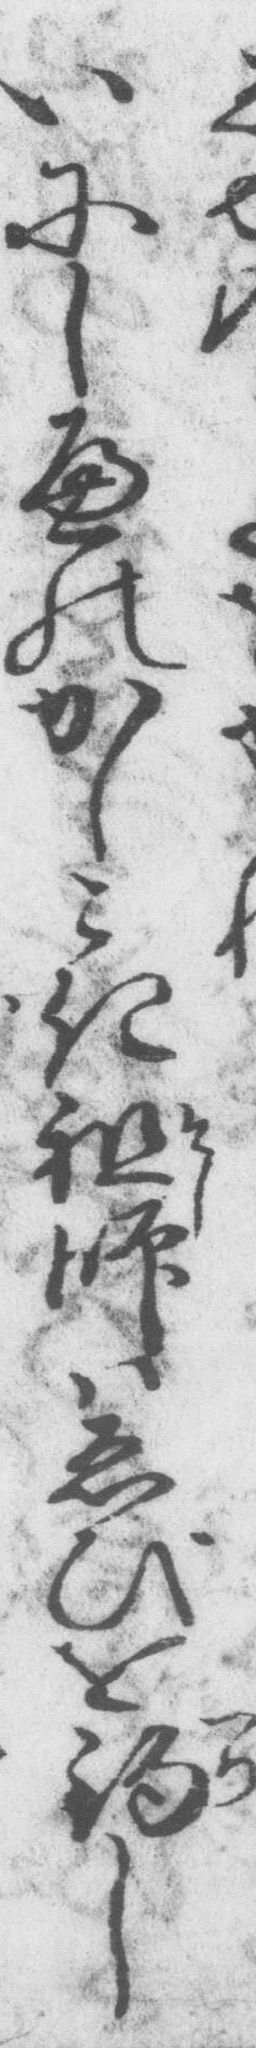いにしへのかしこき祖師はゑびを釣し
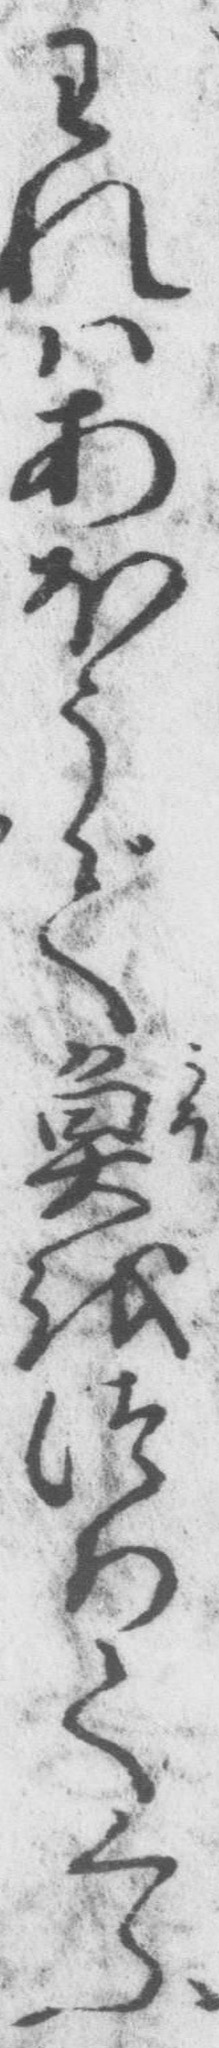われはあほうで魚をつりてくふ
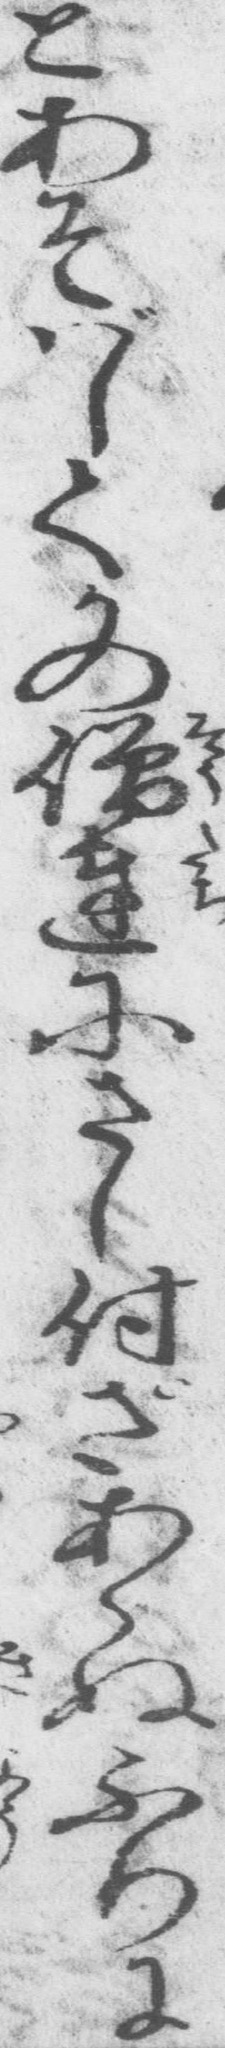とあそばしてかの僧達にさし付。さあらぬふりに
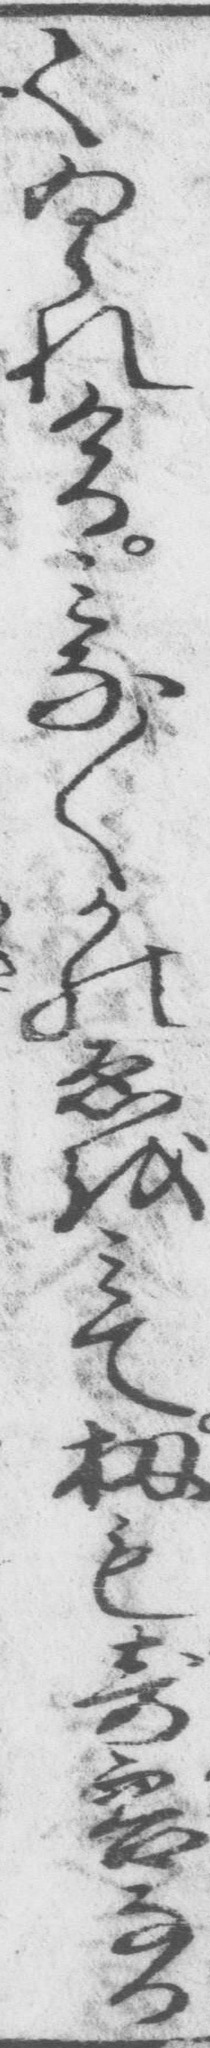てゐられける。みな〳〵かのゑをみて。扨も奇容なる
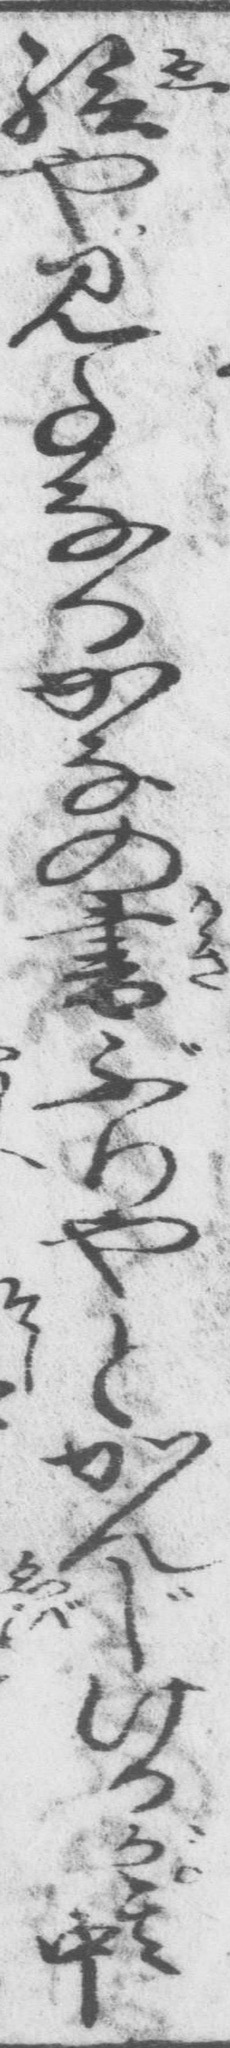絵や見事なるかなの書ぶりやとかんじけるが。其中
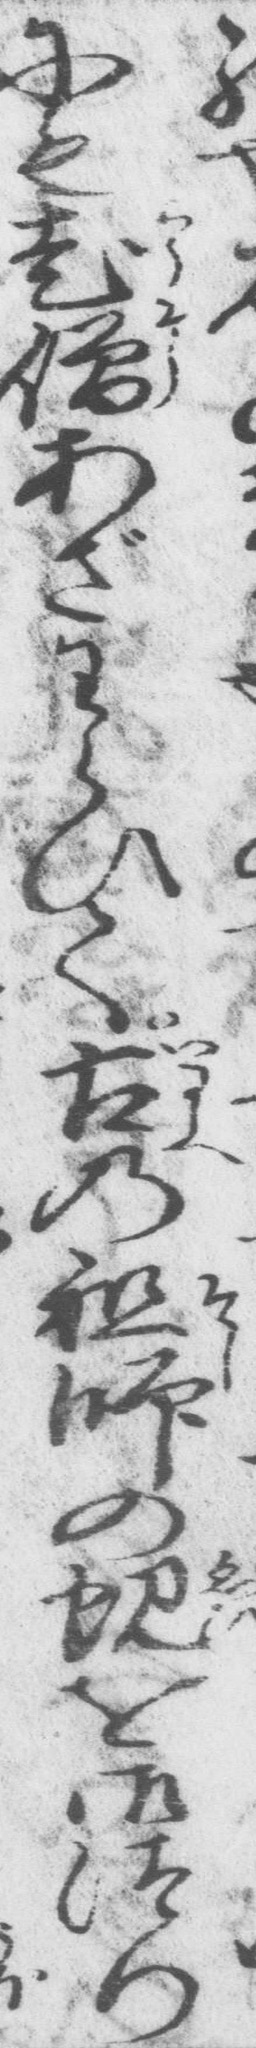にも老僧あざわらひて。古の祖師の蜆を御つり
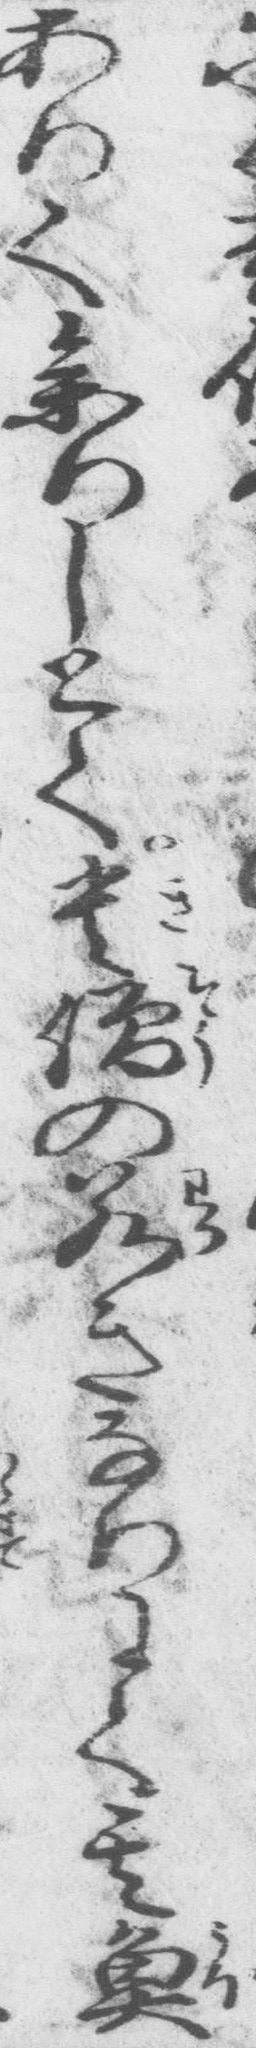ありく参りしとて。貴僧の若きなりにて其魚
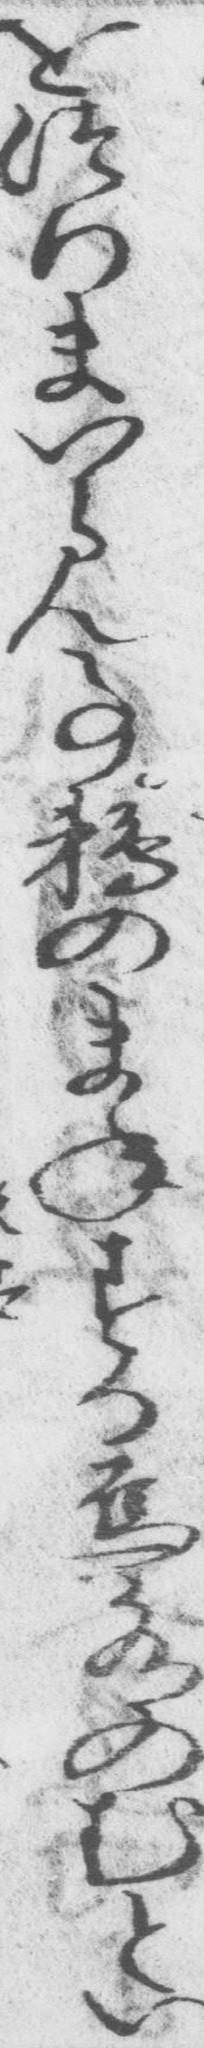をつりまいらん事。鵜のまねする烏水のむとい
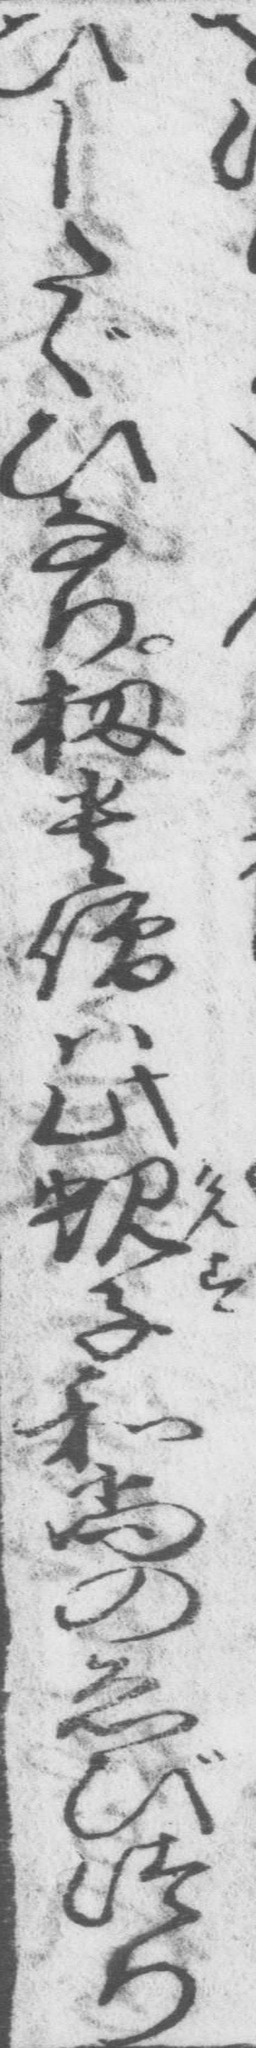ひしたぐひなり。扨貴僧は此蜆子和尚のゑびつり
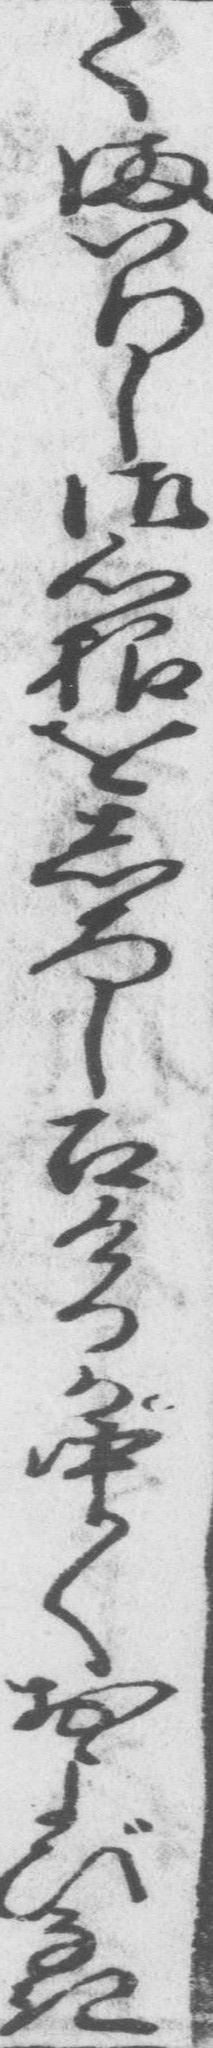てまいりし御心様をしろし召けるか。中〳〵およびなき
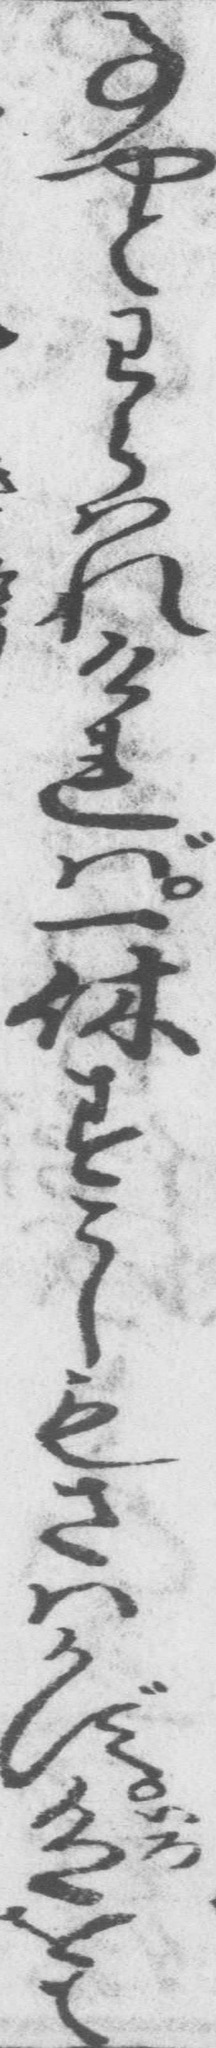事やとわらはれければ。一休すこしもさはかず色をも
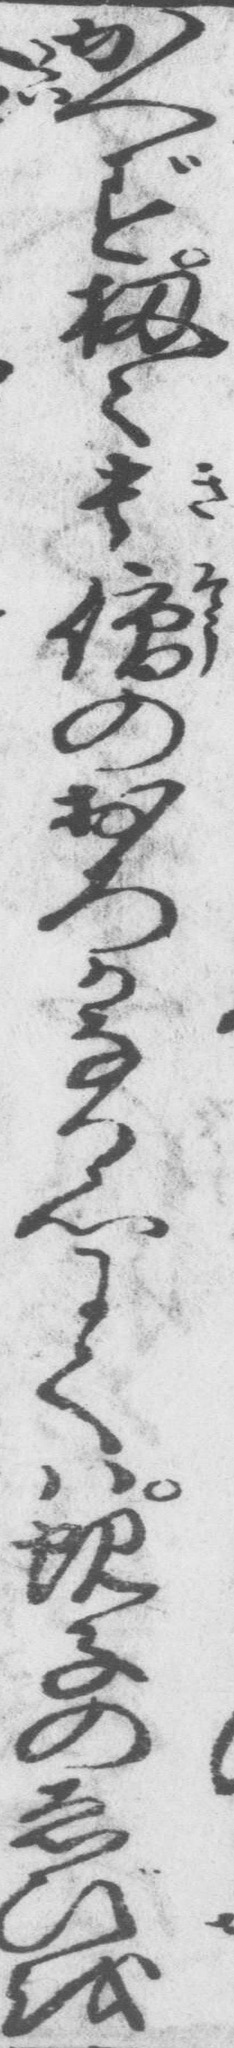かへず。扨々貴僧のおろかなる心にては。蜆子のゑひを
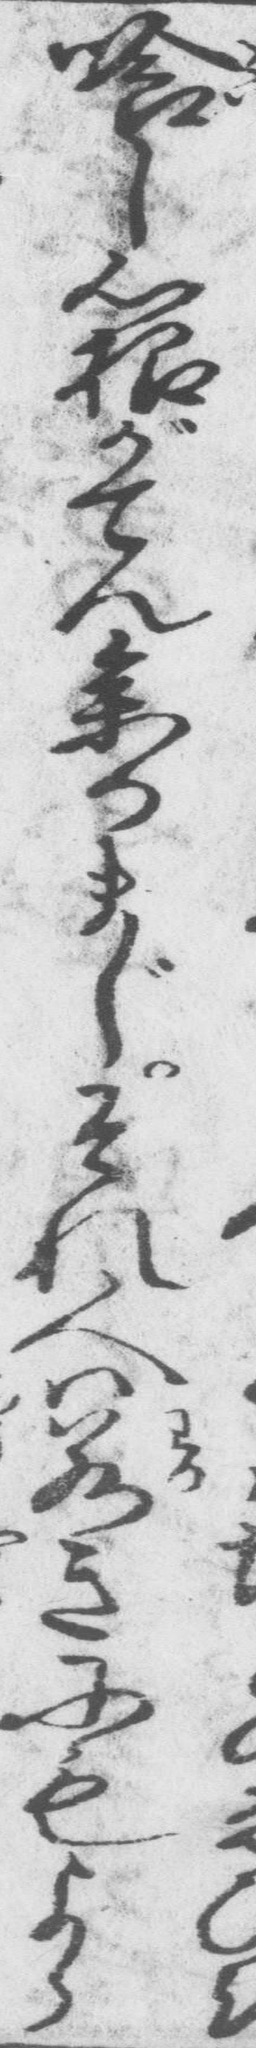喰し心根がてん参るまじ。それ人は若きにもよら
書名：一休はなし（元禄十三）
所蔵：大阪公立大学中百舌鳥図書館 国文学研究資料館
